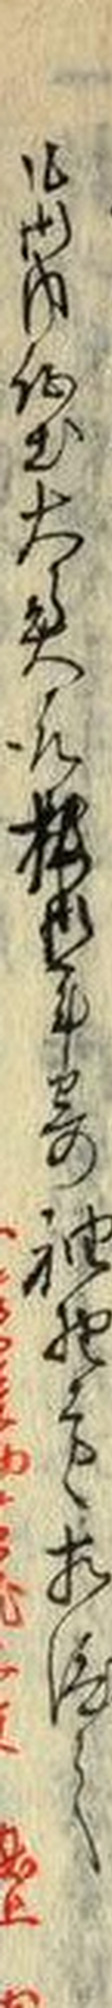も御内証出大奥取扱御年寄袖野方へ相渡之
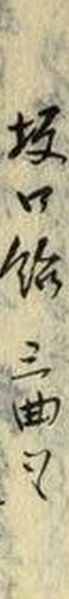坂口飴三曲ツヽ
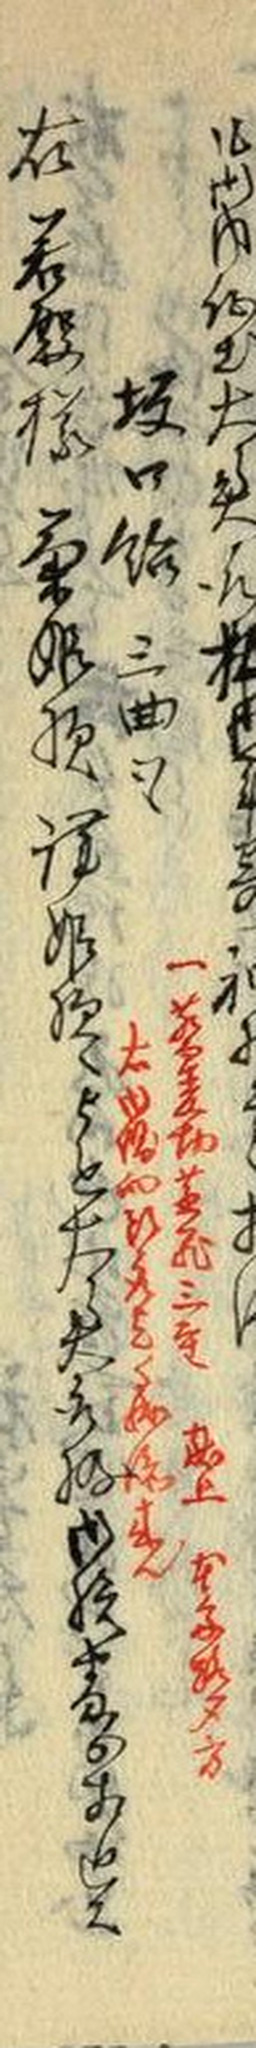右若殿様菊姫様謹姫様へ被進大奥取扱御膳番ゟ相廻ス
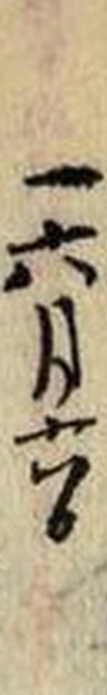一六月六日
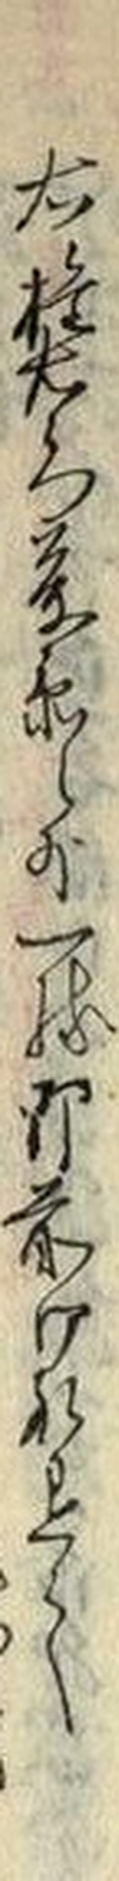右権右衛門藤兵衛之外一統御前御礼申上之
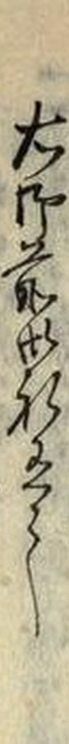右御前御礼有之
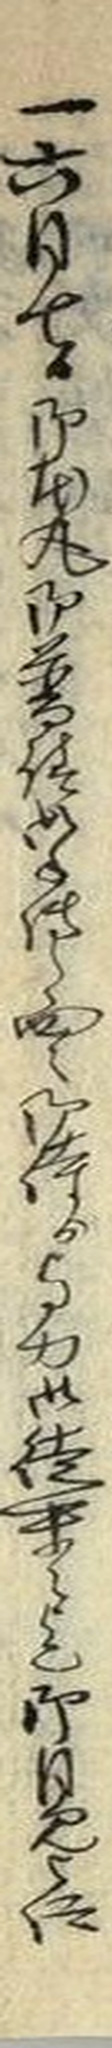一六月七日御本丸御普請御手伝之面々御侍ゟ与力御徒末々迄御目見被仰
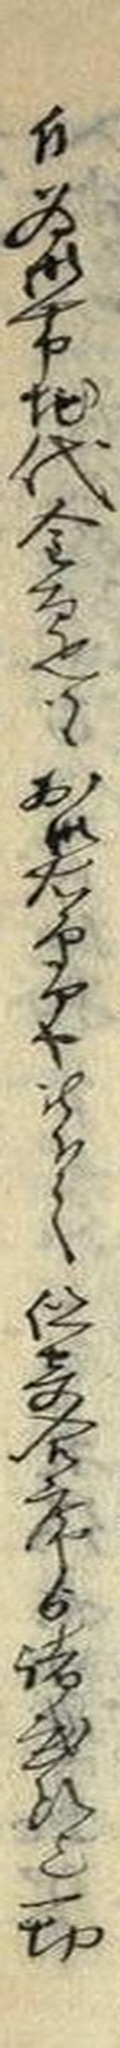付為御帯地代金百疋ツヽ於御右筆部や被下之但寄合席ゟ諸武頭迄一切
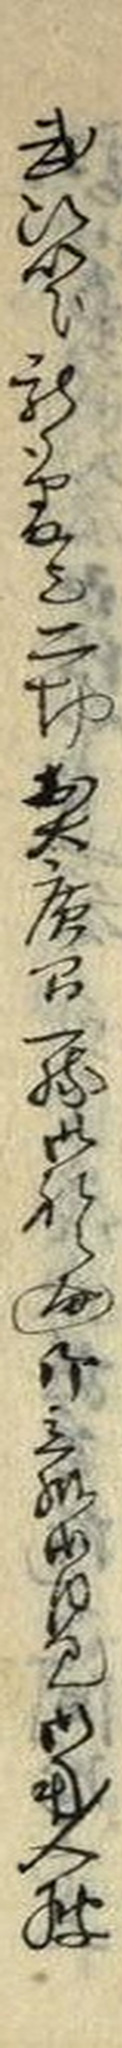武頭以下新御番迄二切於大広間一統御礼之通御立掛御目見御用人披

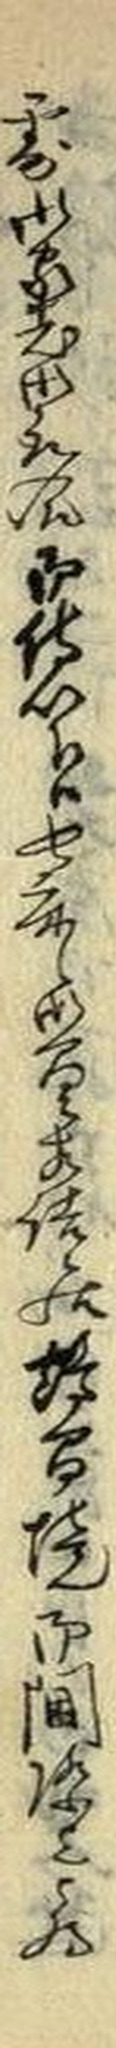露御家老御取合御侍以下ハ長床之御間ニ相詰居鶴之間境御間際迄被為
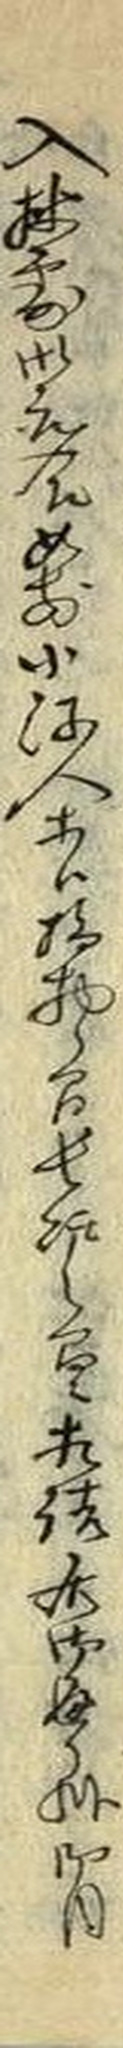入披露御取合如前小役人等ハ指物之間長炉之間ニ相詰居御通り掛御目
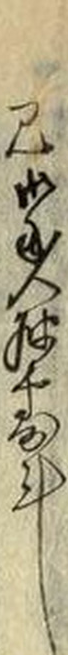見御用人披露斗
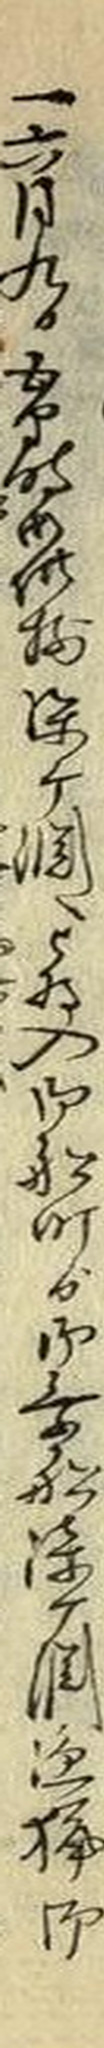一六月九日五半時御供揃漆ケ淵へ被為入御船町ゟ御乗船漆ケ淵漁猟御
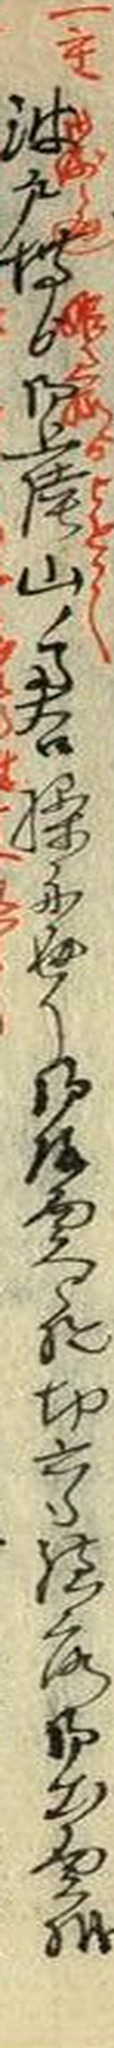波戸場ゟ御上陸山ノ奥口繰舟通り御帰殿被遊切六ツ鎌落御出殿掛
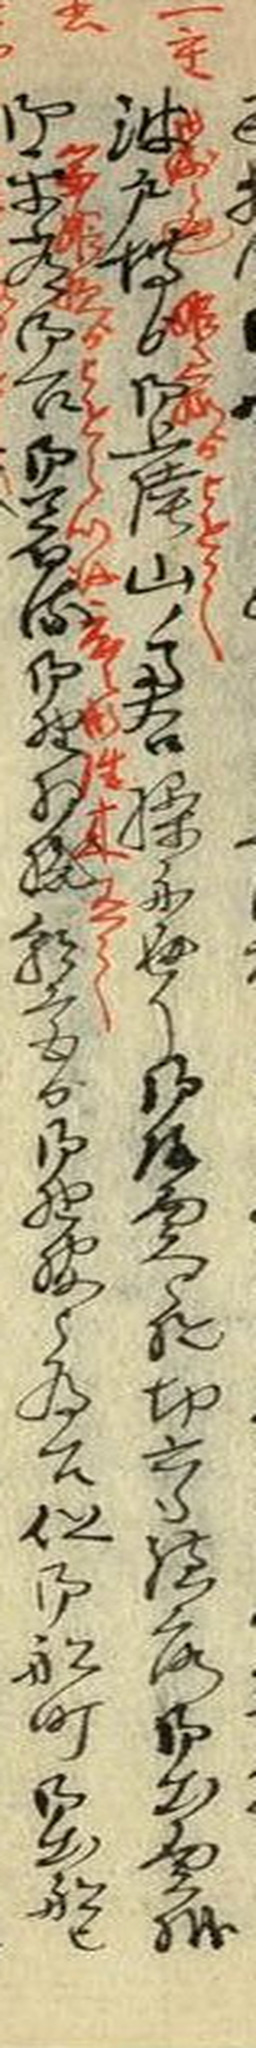御平常御召御着流御野羽織朝宮ゟ御野服被為召但御船町御出船被
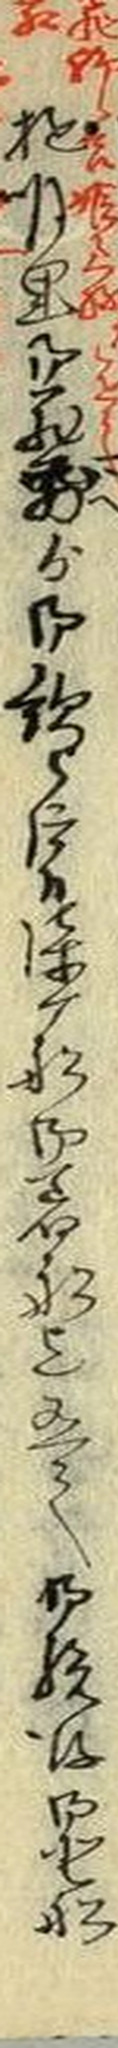遊明里御蔵前ゟ御歌被仰付漆ケ船御着船迄有之御膳後御登船
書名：少傅日録抄（斉承付側向頭取日記、在国）
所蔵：福井県文書館 Fukui Prefectural Archives
